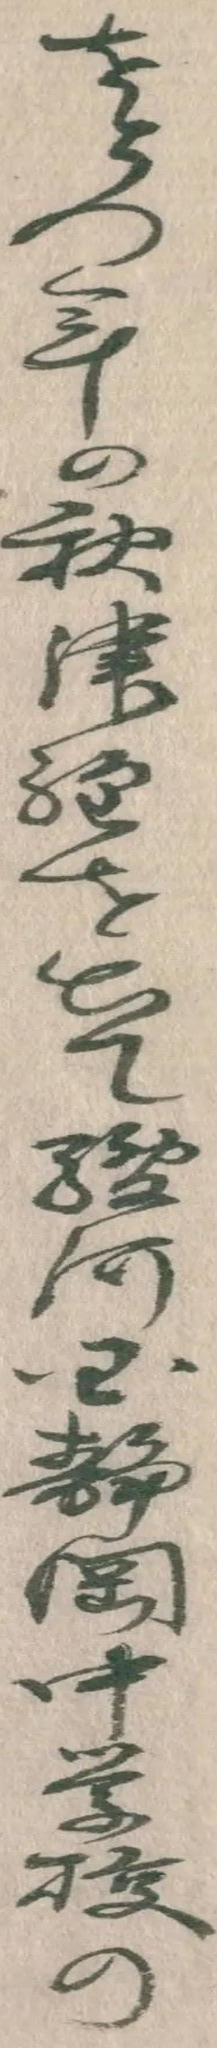をとつ年の秋津軽を出て駿河国静岡中学校の
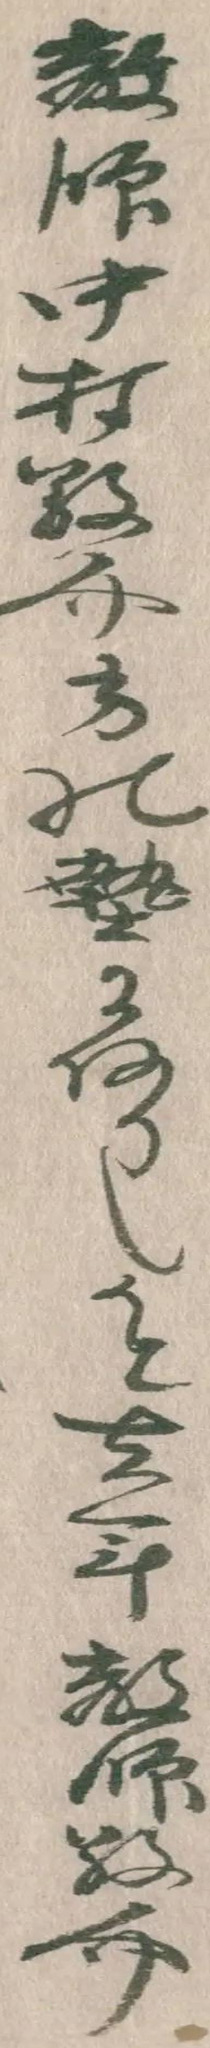教師中村敬介方の塾にありしかと去年教師敬介
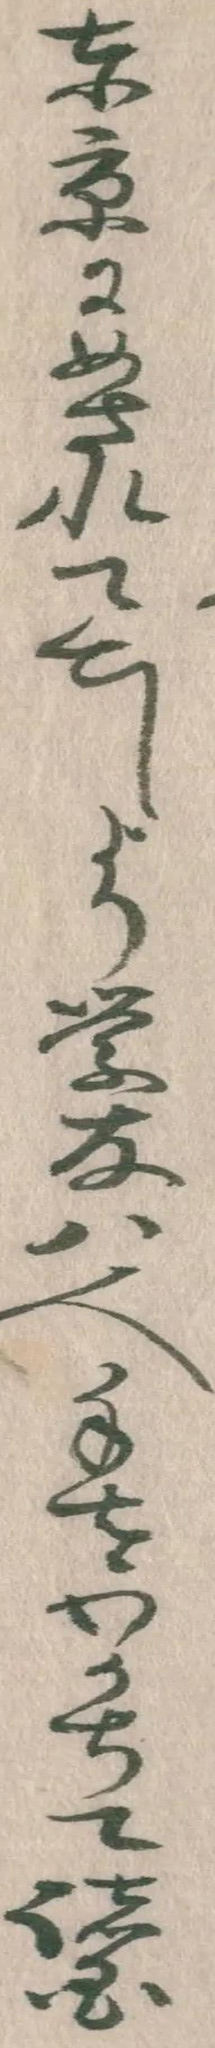東京にめされて出しより学友は人手をわかちて諸国
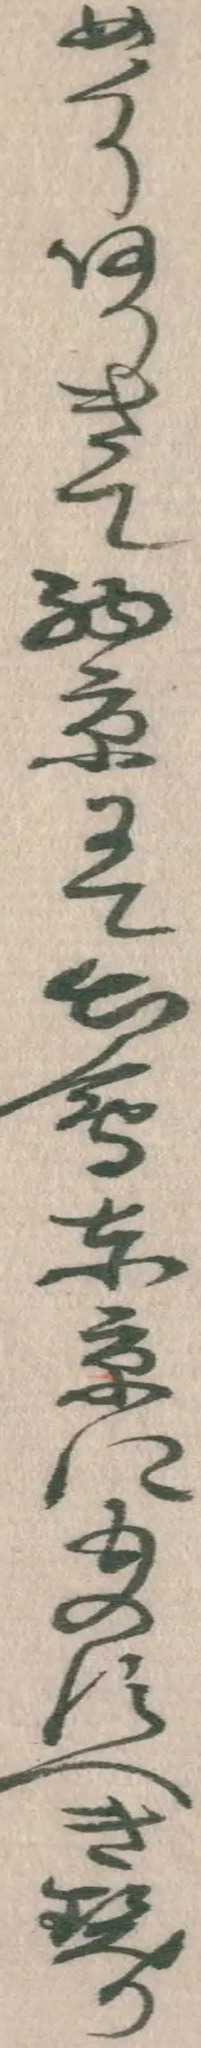めくりありきて西京にて出会東京にものすへき契り
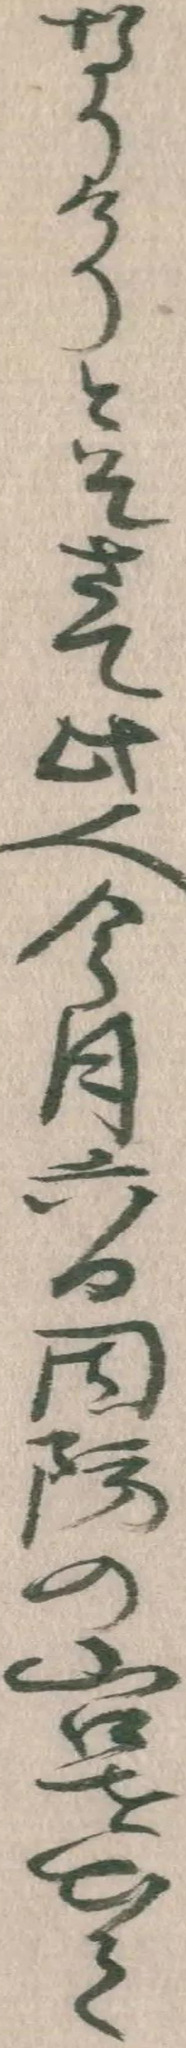なりけりとそさて此人今月六日周防の山口を出て
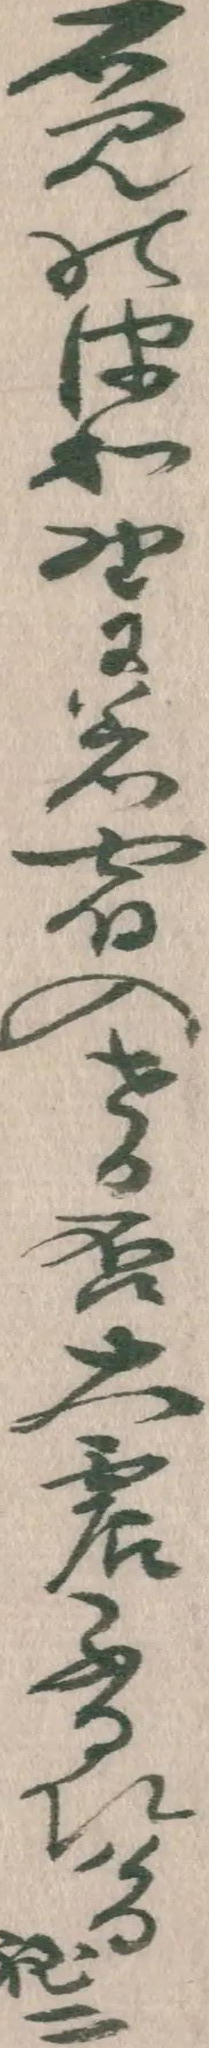石見の津和野に着宿入せる否大震ふるひける程に
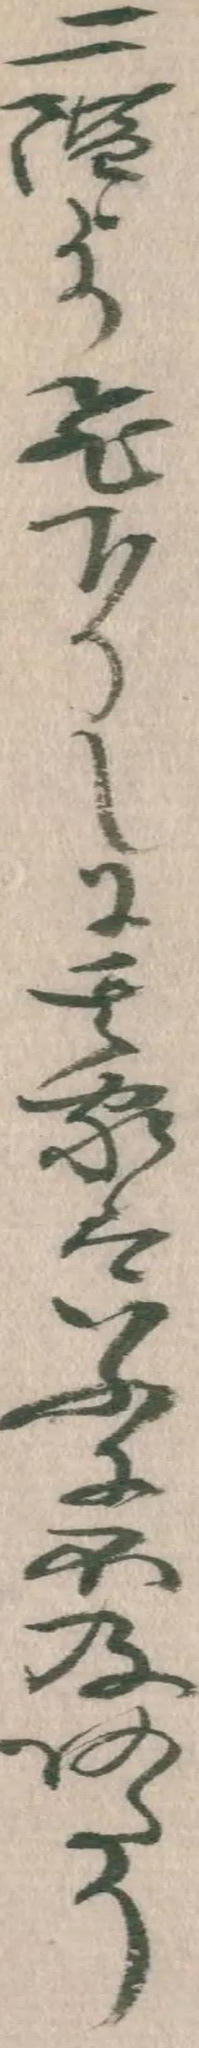二階より飛下りしに其家はいふに不及あたり
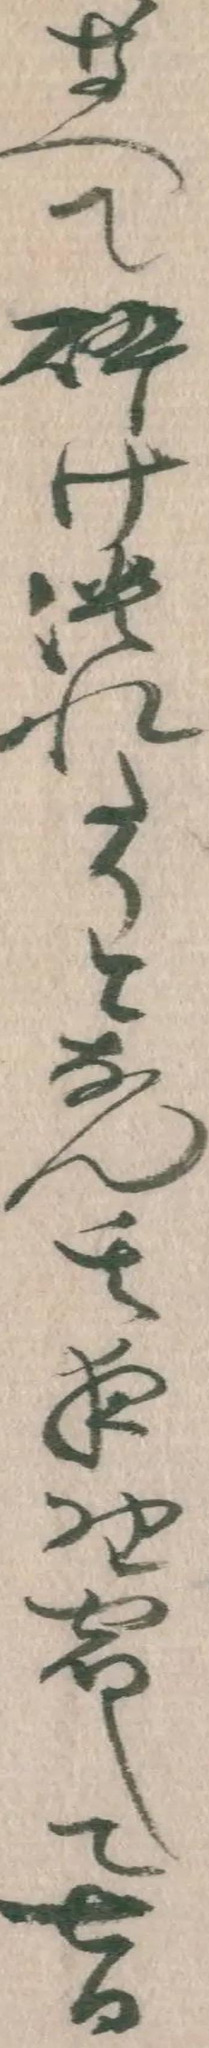なへて砕け潰れたりとなん其夜野宿して七日
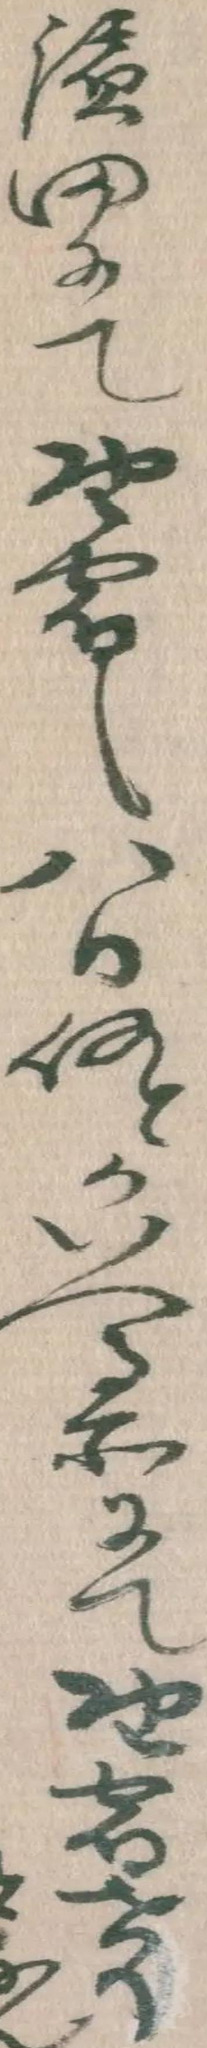浜田にて野宿し八日何とかいへる所にて野宿せりとなん
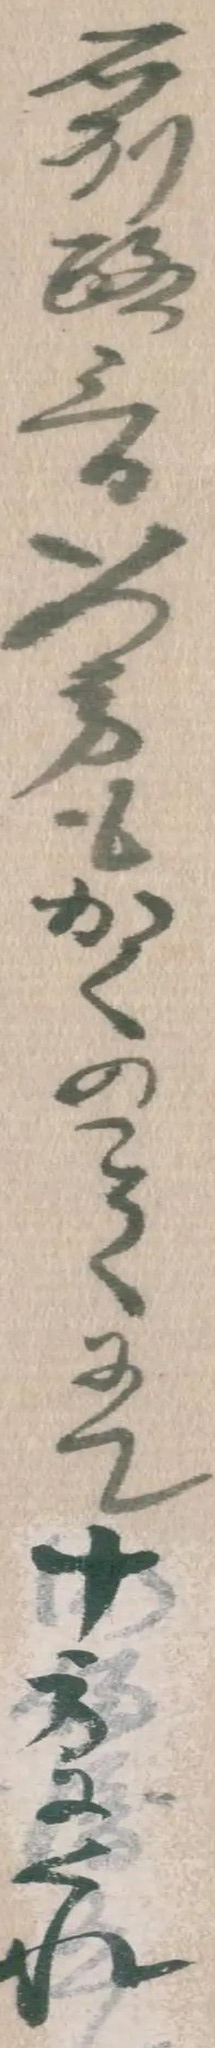石州路三日いつ方もかくのことくにて十方にくれ
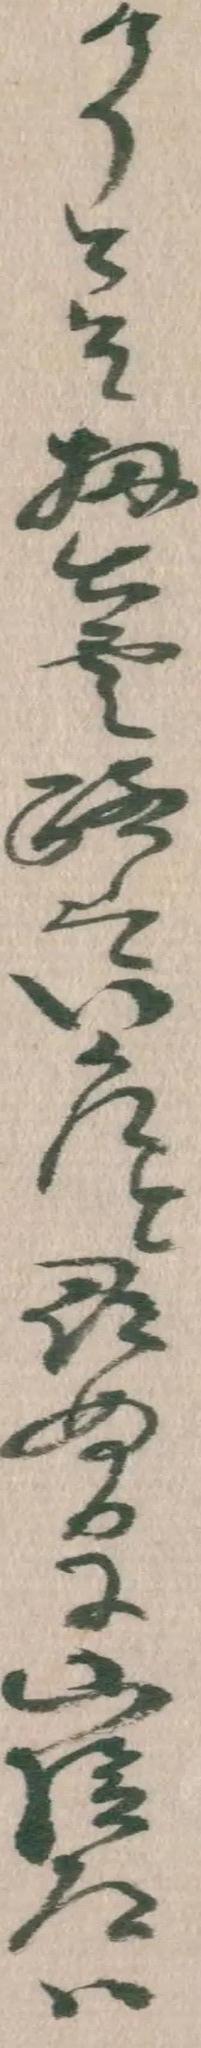けりとそ扨出雲路はいかにと尋ぬるに山陰道は
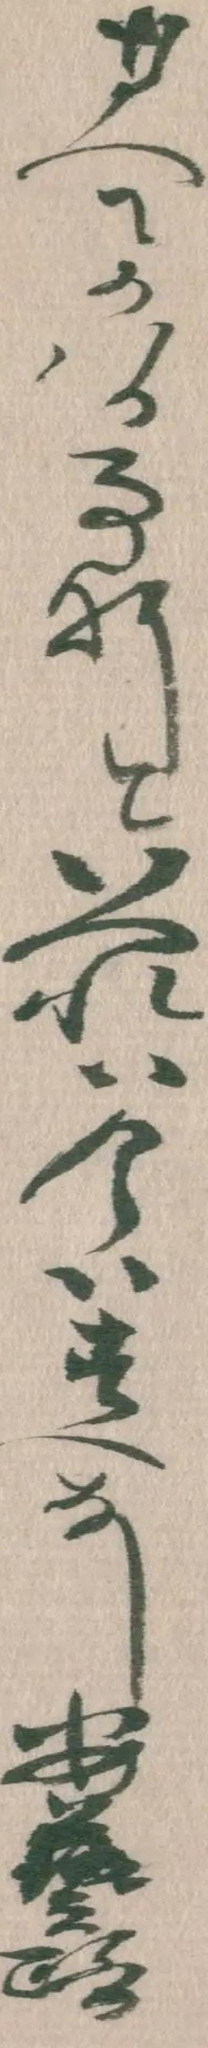なへてかはる事なしといへれは今はすへなし安芸路ゟ
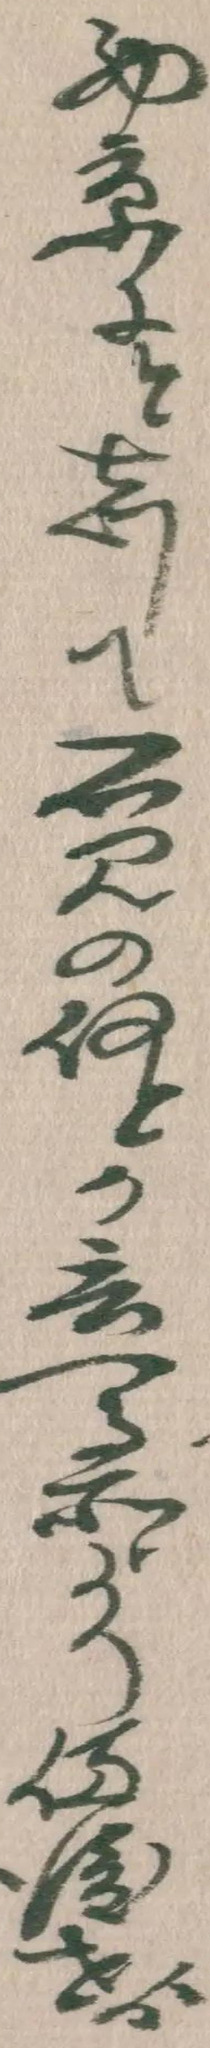西京にと志して石見の何とか言へる所より備後を
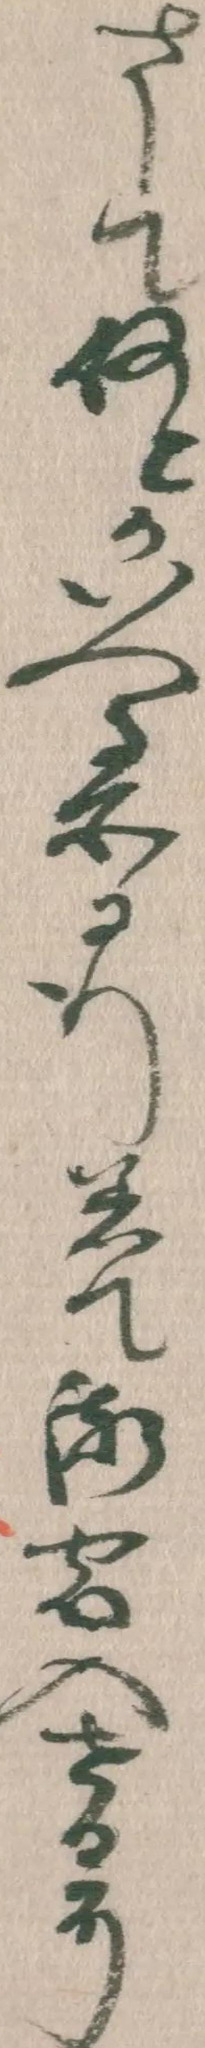さして何とかいへる所に行着て漸宿入せるに
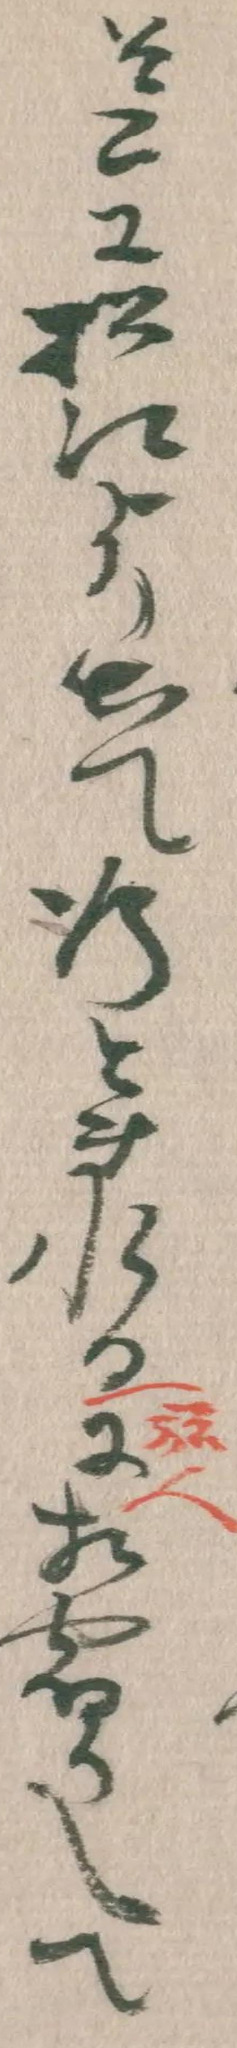そこに松江より出て行とまれる旅人に相宿りして
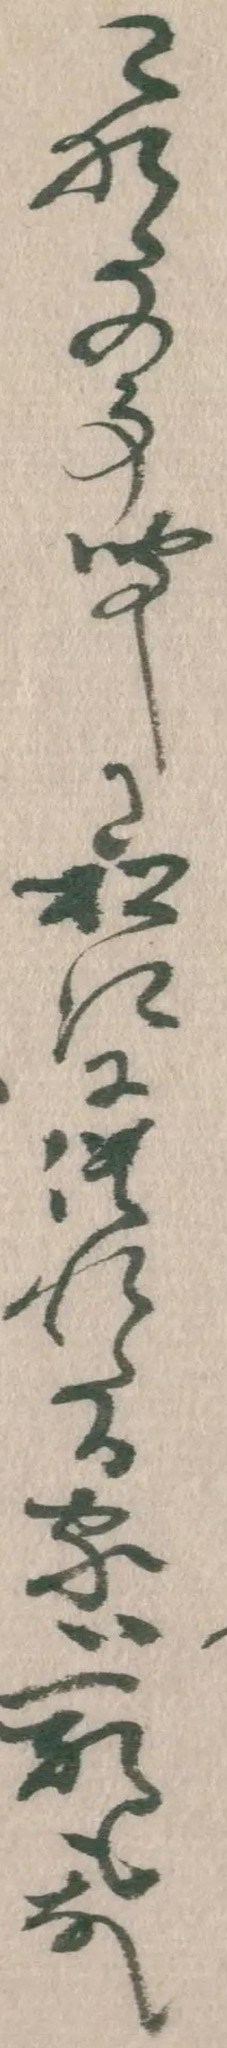こなたの事聞しに松江に潰れたる家は一軒もなし
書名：出雲紀行. 20
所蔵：国立国会図書館 National Diet Library, JAPAN
